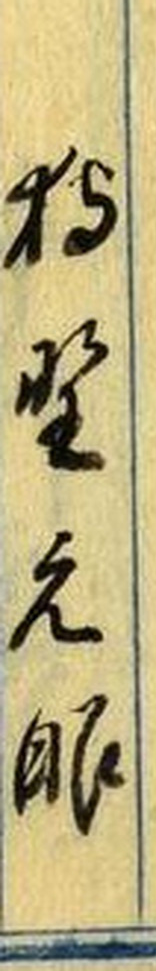狩野元昭
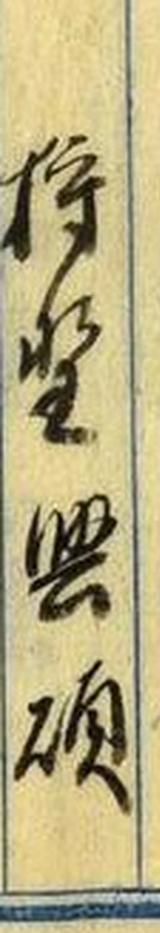狩野興碩
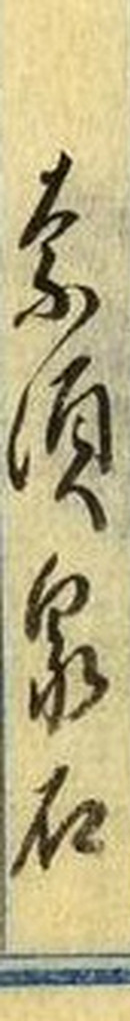奈須泉石

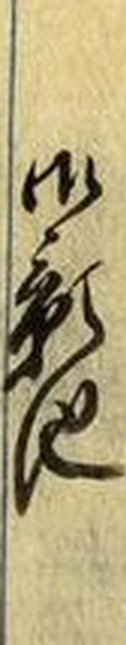御影池
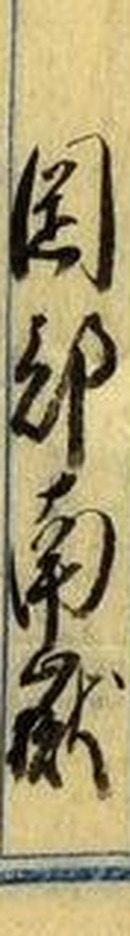岡部南嶽
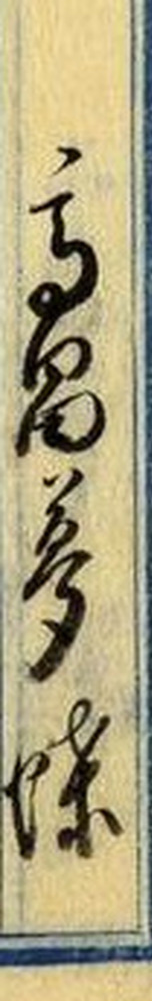高畠夢蝶
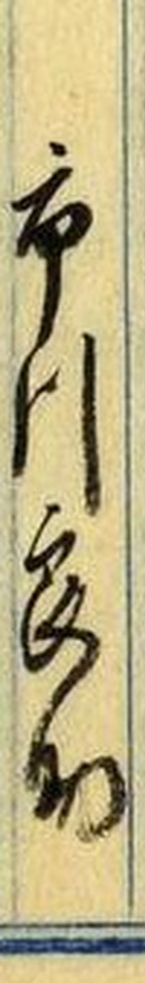市川良助
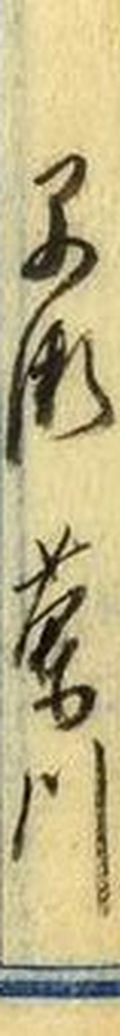早瀬蘭川
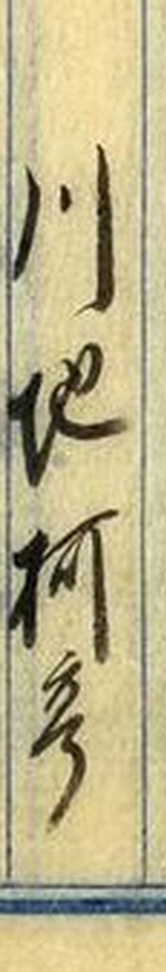川地柯亭

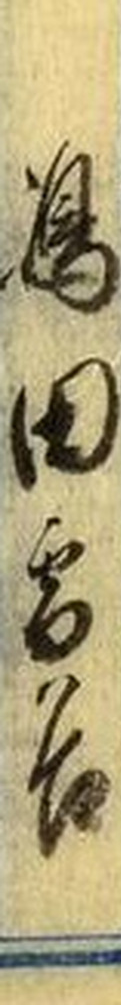嶋田雪谷
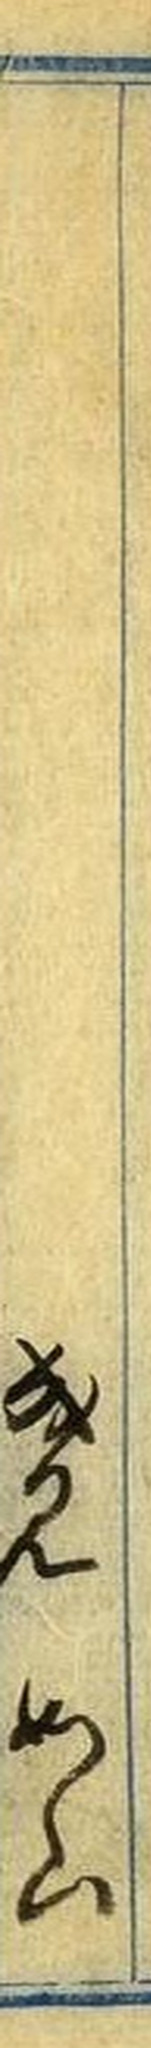成見如山
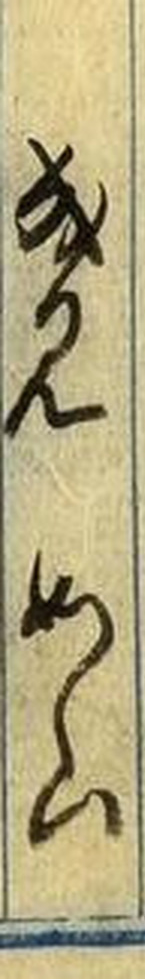成見如山
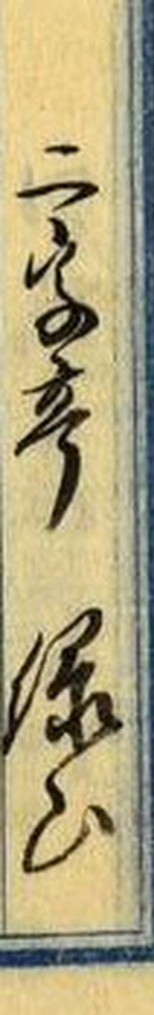二字亭緑山
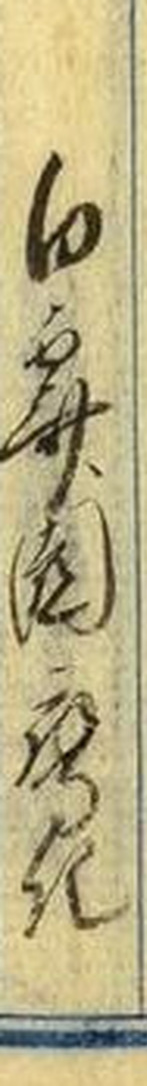白鼻園鷹紀
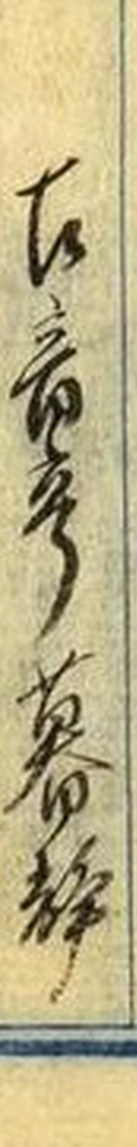古音亭暮静

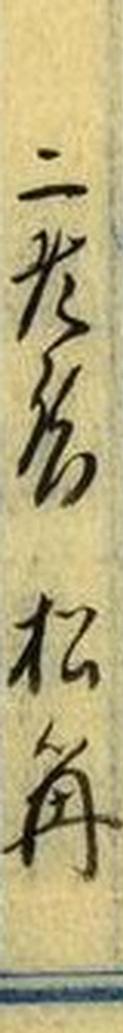二老庵松篝
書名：温古集 四巻
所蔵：福井県文書館 Fukui Prefectural Archives
